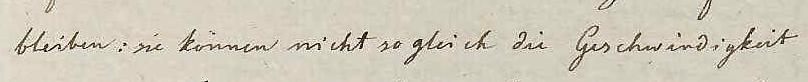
bleiben: sie können nicht so gleich die Geschwindigkeit
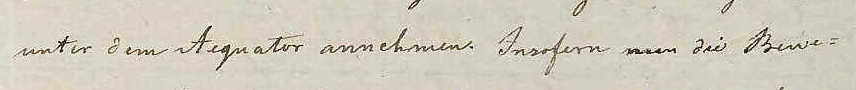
unter dem Aequator annehmen. Insofern nun die Bewe-
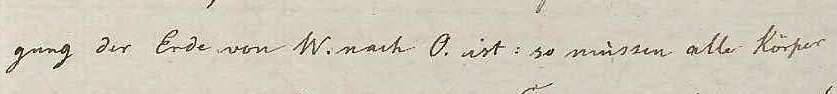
gung der Erde von W. nach O. ist: so müssen alle Körper
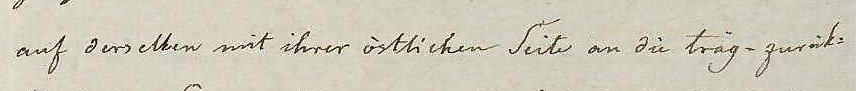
auf derselben mit ihrer östlichen Seite an die träg-zurük-
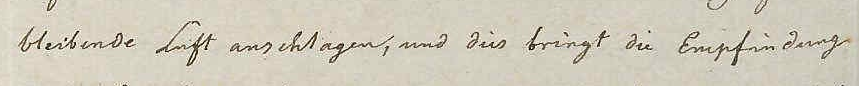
bleibende Luft anschlagen, und dies bringt die Empfindung
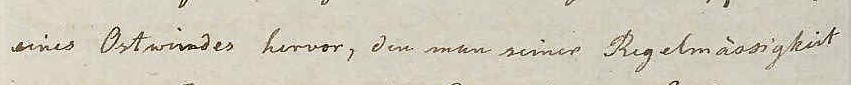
eines Ostwindes hervor, den man seiner Regelmässigkeit
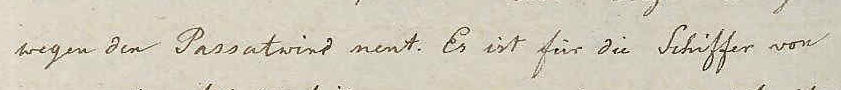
wegen den Passatwind nent. Es ist für die Schiffer von
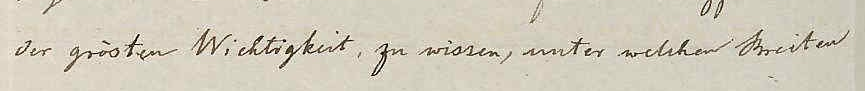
der grösten Wichtigkeit, zu wissen, unter welchen Breiten
